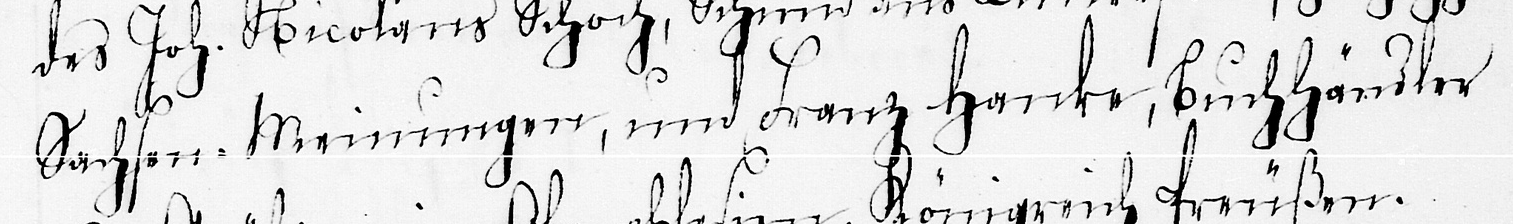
Sachsen-Meinungen, und Franz Hanke, Buchhändler
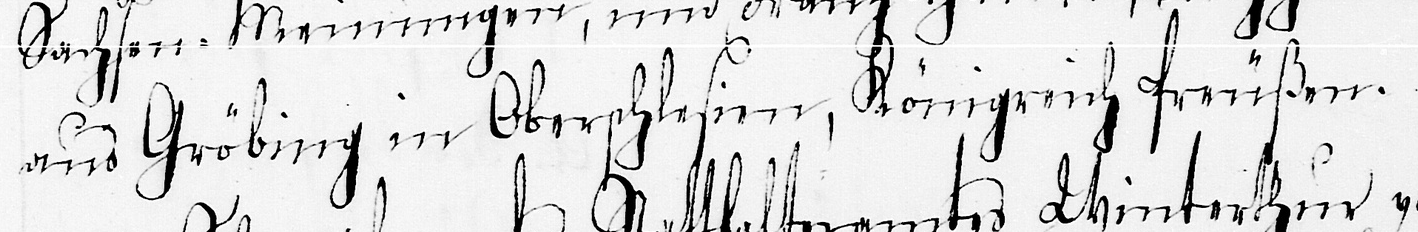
aus Gröbing in Oberschlesien, Königreich Preußen.
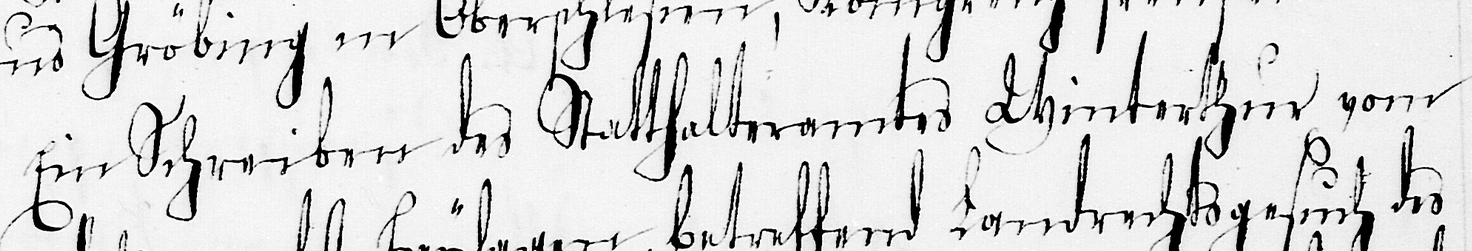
Ein Schreiben des Statthalteramtes Winterthur vom
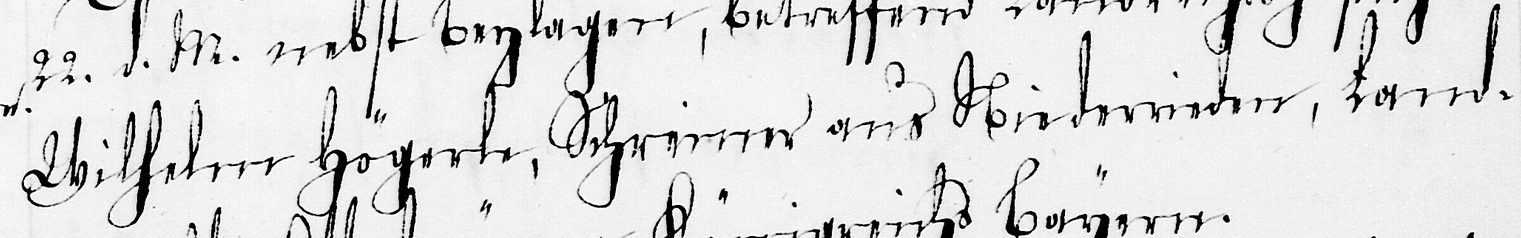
Wilhelm Högerle, Schreiner aus Niederrieden, Land¬
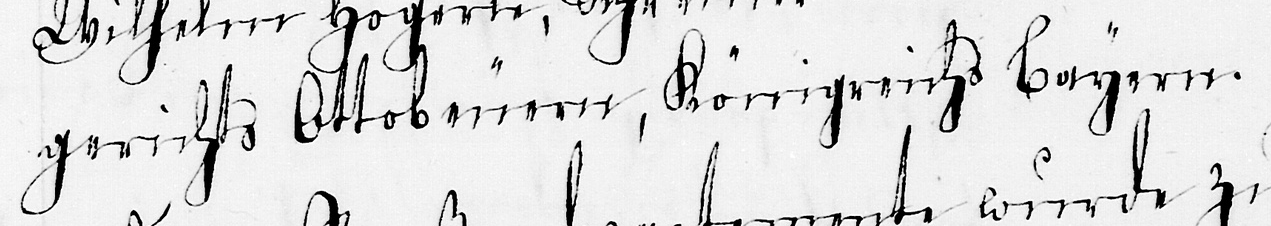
gerichts Ottobeuern, Königreichs Bayern.
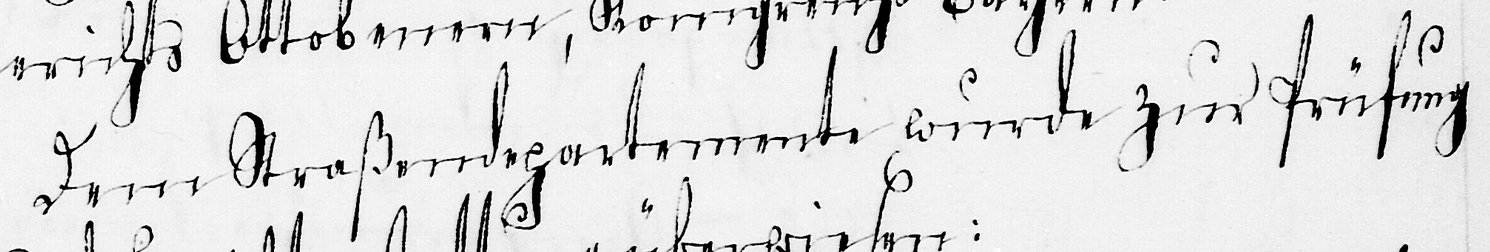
Dem Straßendepartemente wurde zur Prüfung
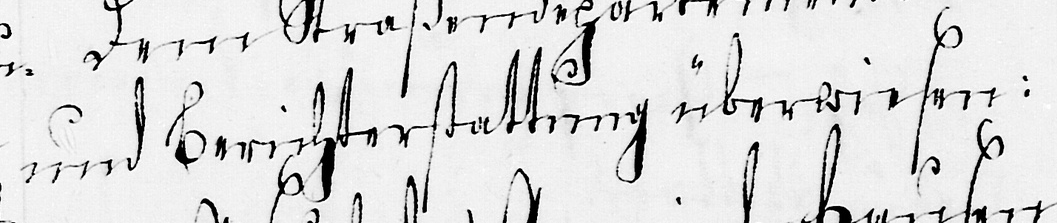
und Berichterstattung überwiesen:
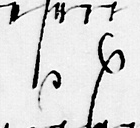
22.
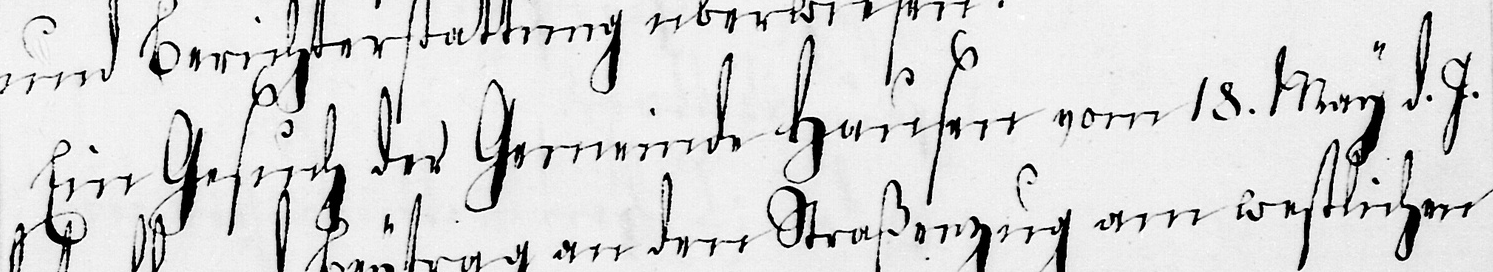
Ein Gesuch der Gemeinde Hausen vom 18. März d.
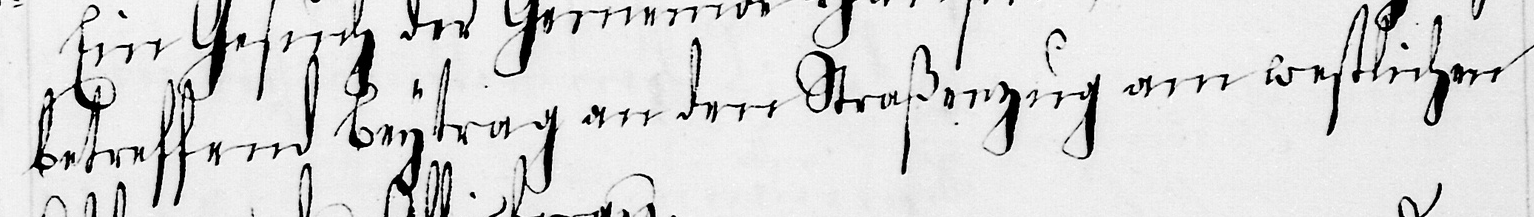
betreffend Beytrag an den Straßenzug am westlichen
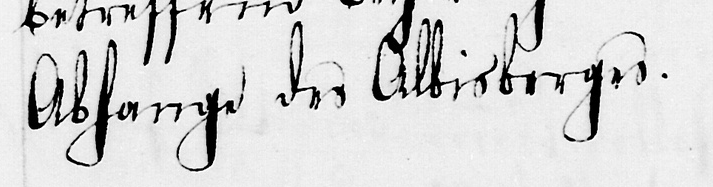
Abhange des Albisberges.
